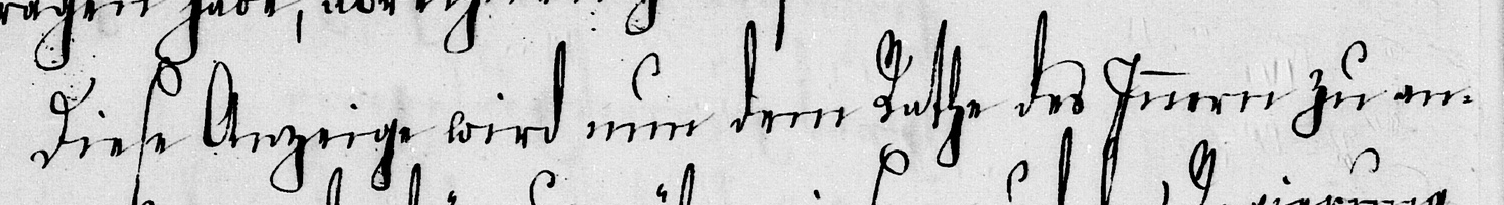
Diese Anzeige wird nun dem Rathe des Innern zu an¬
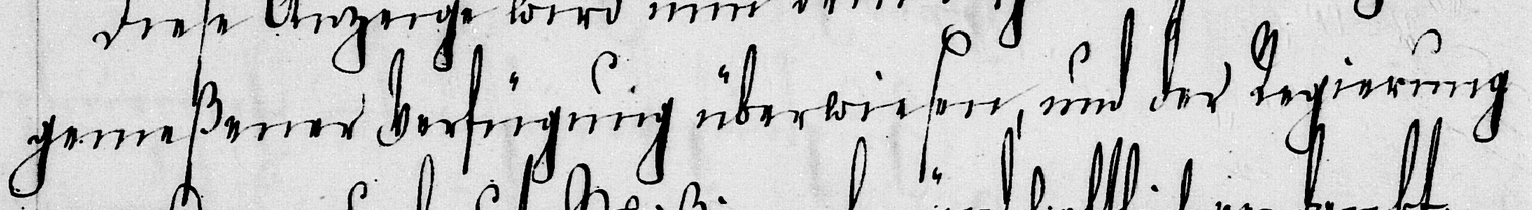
gemeßener Verfügung überwiesen, und der Regierung
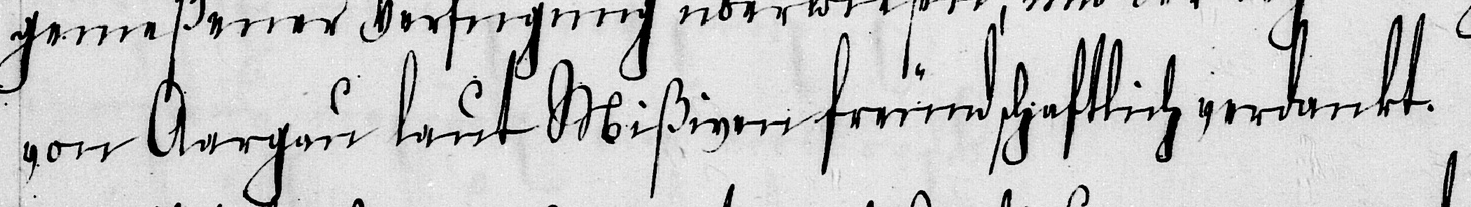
von Aargau laut Mißiven freundschaftlich verdankt.
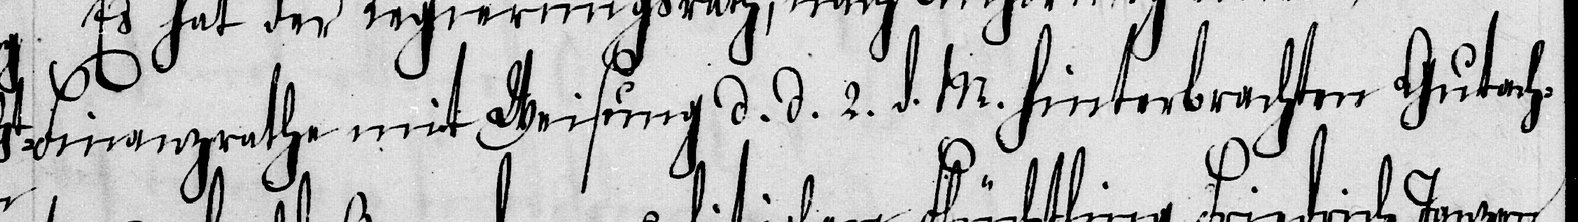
Finanzrathe mit Weisung d. d. 2. d. M. hinterbrachten Gutach¬
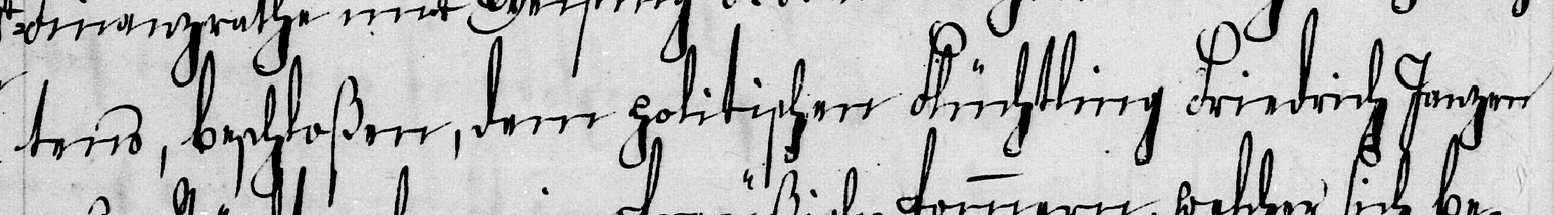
tens, beschloßen, dem politischen Flüchtling Friedrich Janzen
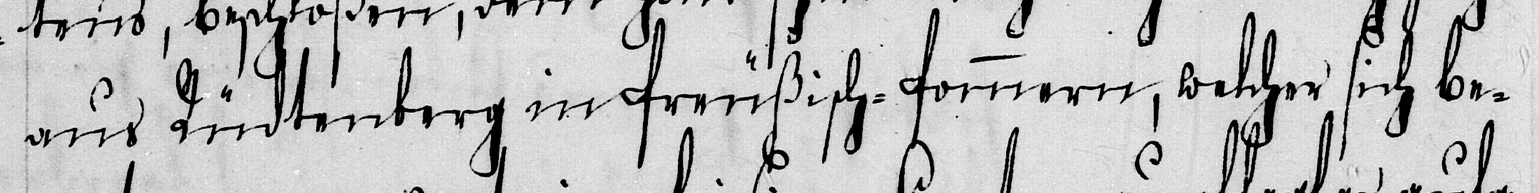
aus Rüdtenberg in Preußisch-Pommern, welcher sich be¬
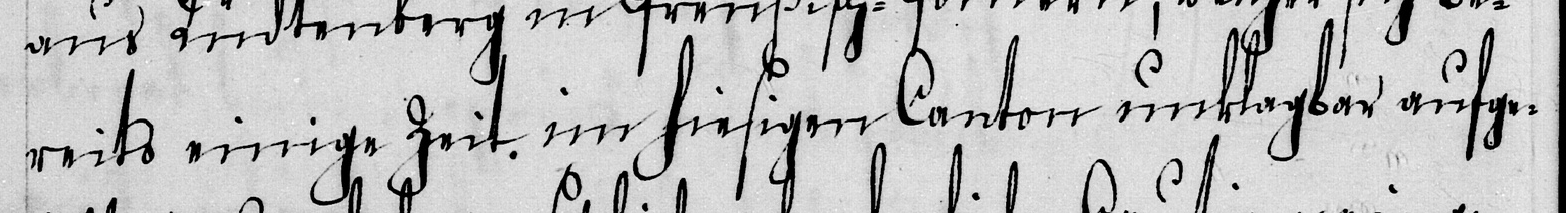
reits einige Zeit im hiesigen Canton unklagbar aufge¬
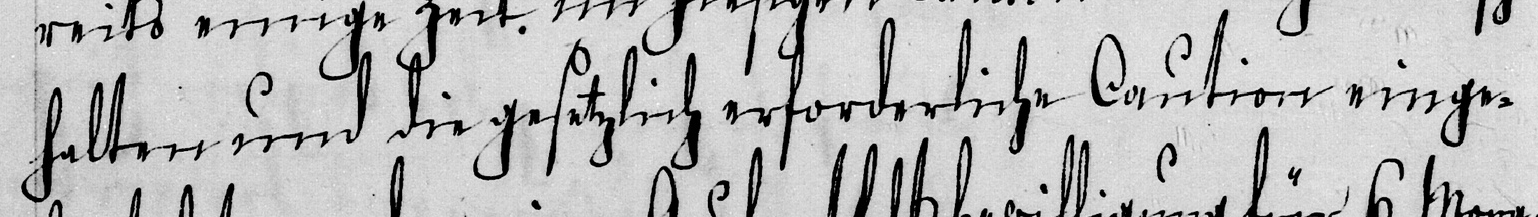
halten und die gesetzlich erforderliche Caution einge¬
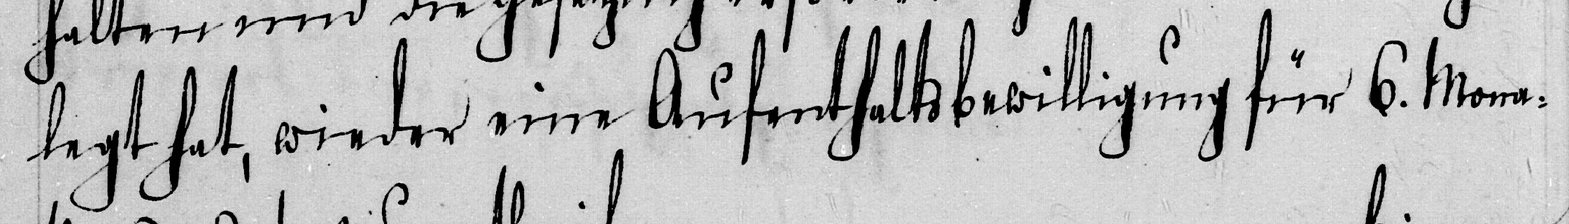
legt hat, wieder eine Aufenthaltsbewilligung für 6. Mona¬
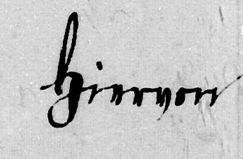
Hiervon
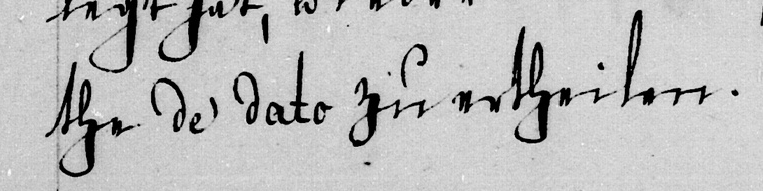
the de dato zu ertheilen.
